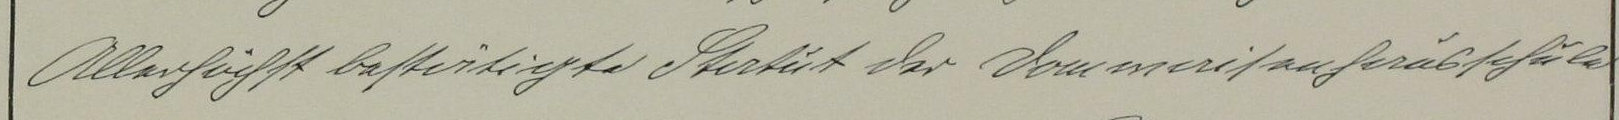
Allerhöchst bestätigte Statut der Domwaisenhausschule
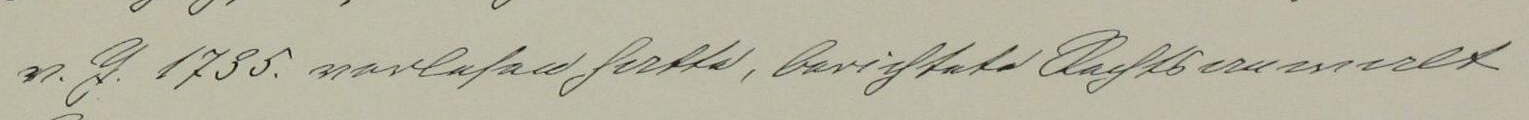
v.J. 1735. verlesen hatte, berichtete Rechtsanwalt
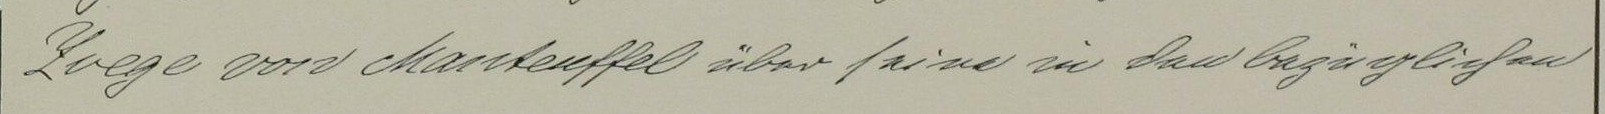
Zoege von Manteuffel über seine in den bezüglichen
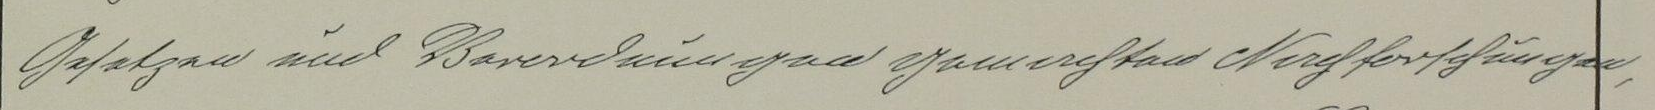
Gesetzen und Verordnungen gemachten Nachforschungen,
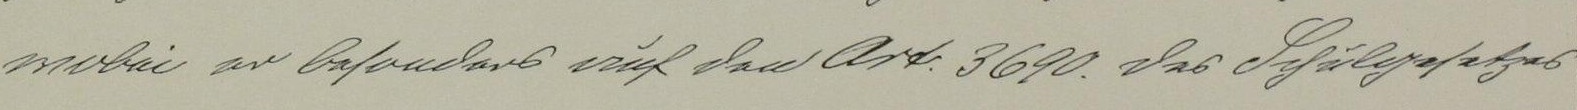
wobei er besonders auf den Art. 3690. des Schulgesetzes
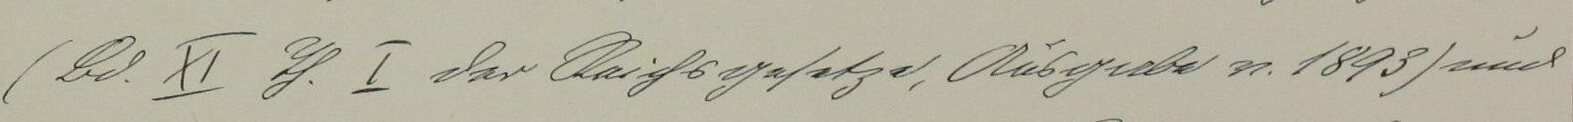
(Bd. XI Th. I der Reichsgesetze, Ausgabe v. 1893) und
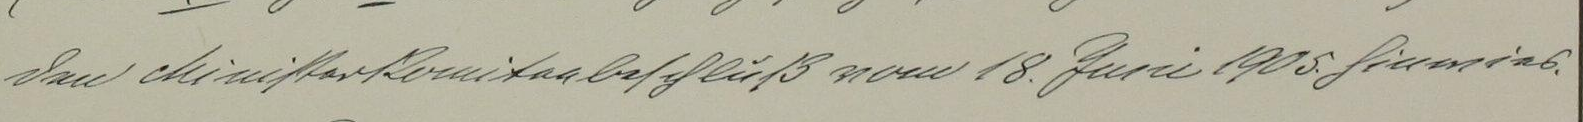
den Ministerkomiteebeschluß vom 18. Juni 1905. hinwies.
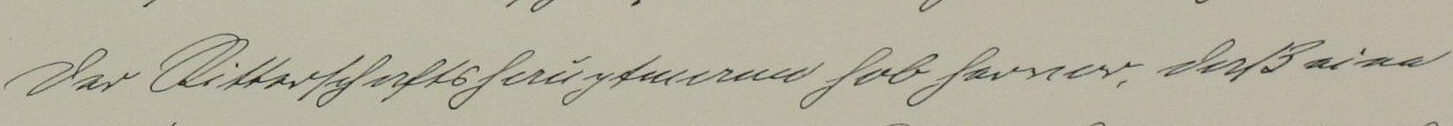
Der Ritterschaftshauptmann hob hervor, daß eine
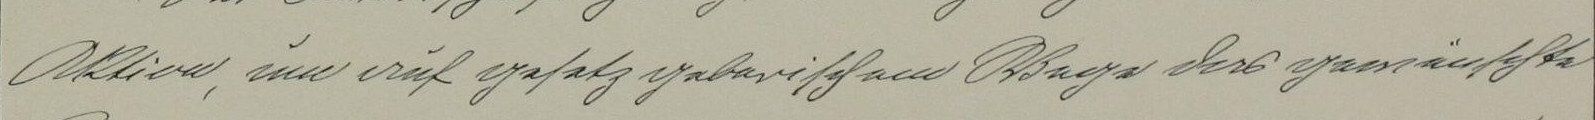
Aktion, um auf gesetzgeberischem Wege das gewünschte
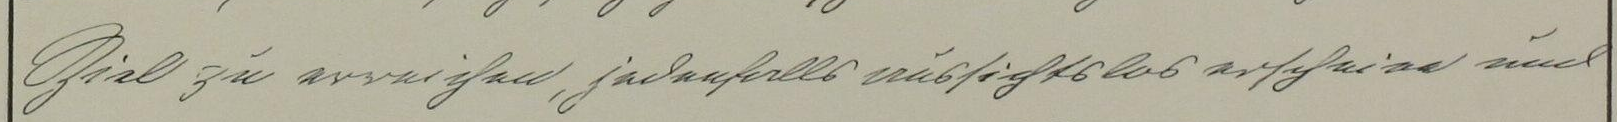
Ziel zu erreichen, jedenfalls aussichtslos erscheine und
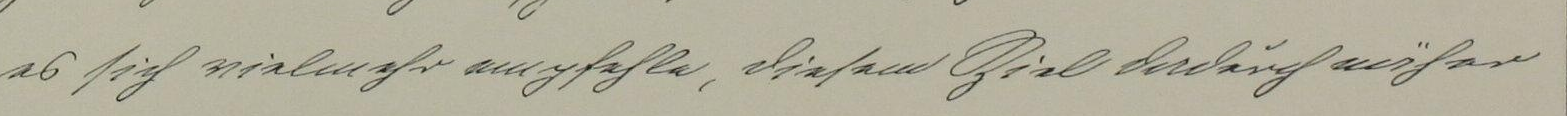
es sich vielmehr empfehle, diesem Ziel dadurch näher
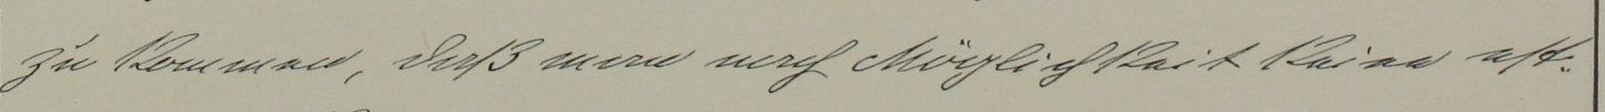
zu kommen, daß man nach Möglichkeit keine est-
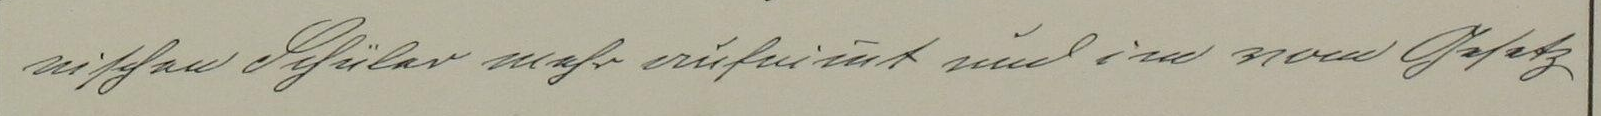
nischen Schüler mehr aufnimmt und im vom Gesetz
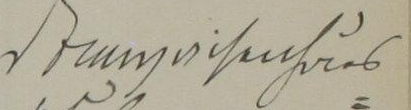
Domwaisenhaus
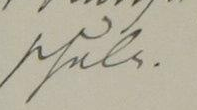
schule.
